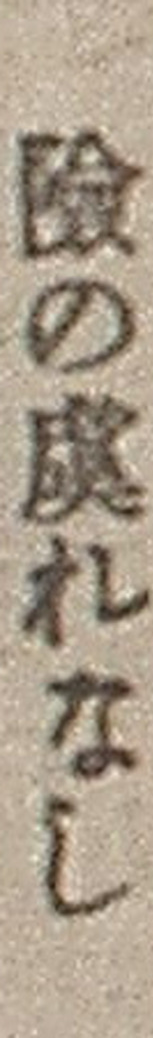険の虞れなし
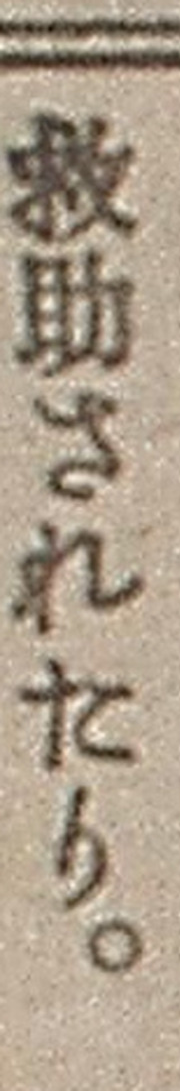救助されたり。
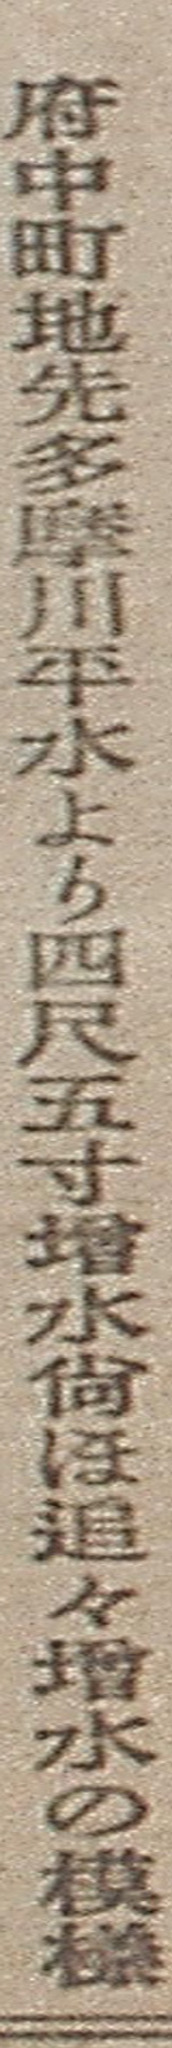府中町地先多摩川平水より四尺五寸増水尚ほ追々増水の模様
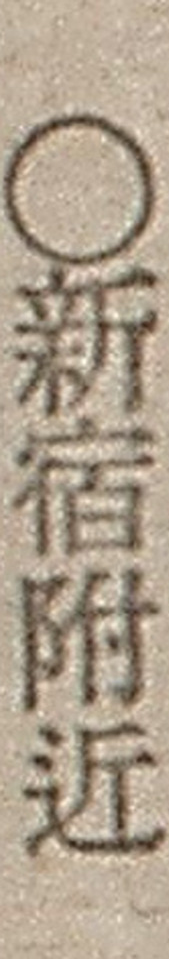〇新宿付近
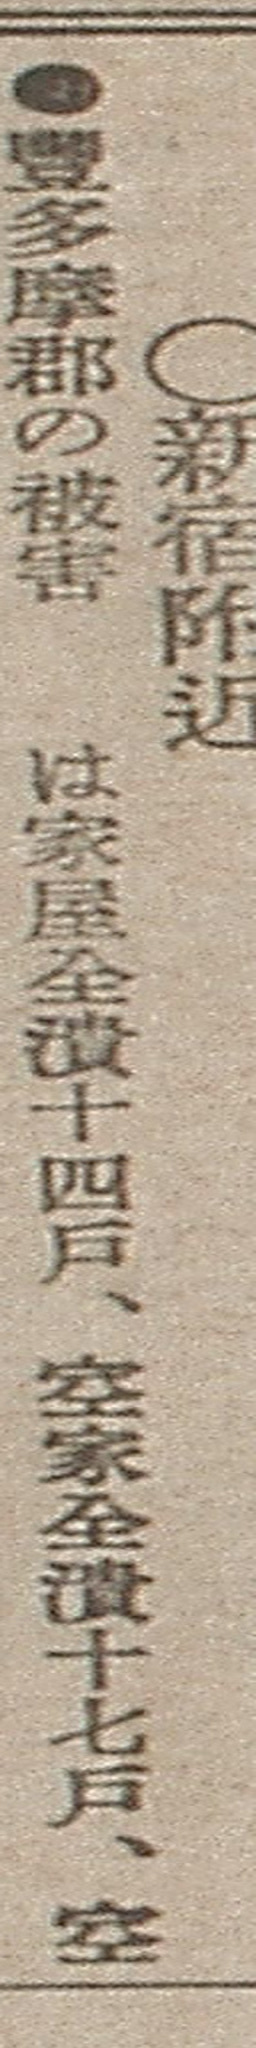●豊多摩郡の被害は家屋全潰十四戸、空家全潰十七戸、空
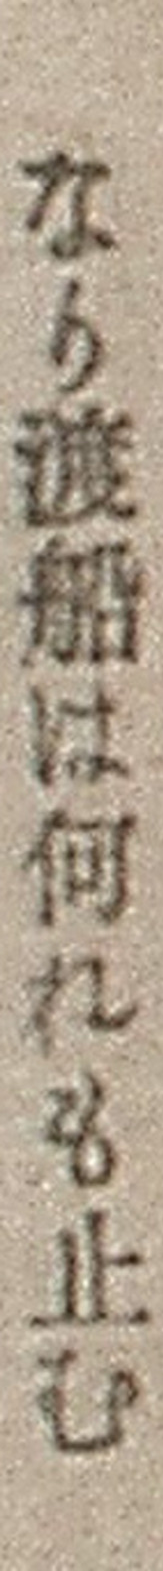なり渡船は何れも止む
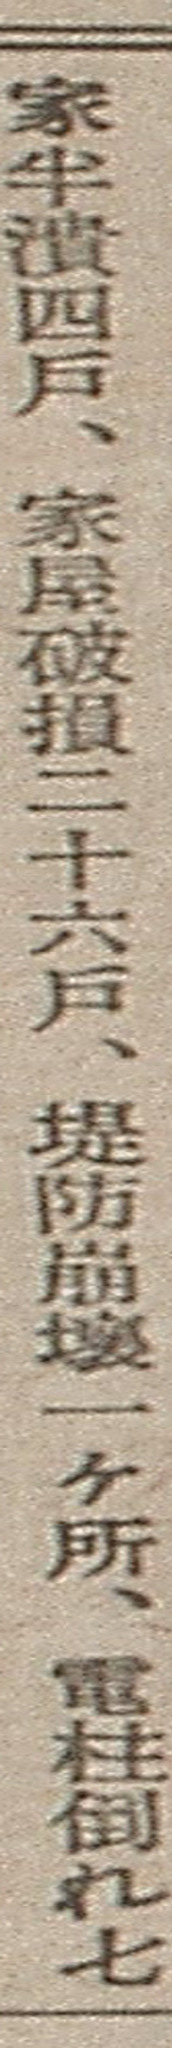家半潰四戸、家屋破損二十六戸、堤防崩壊一ケ所、電柱倒れ七
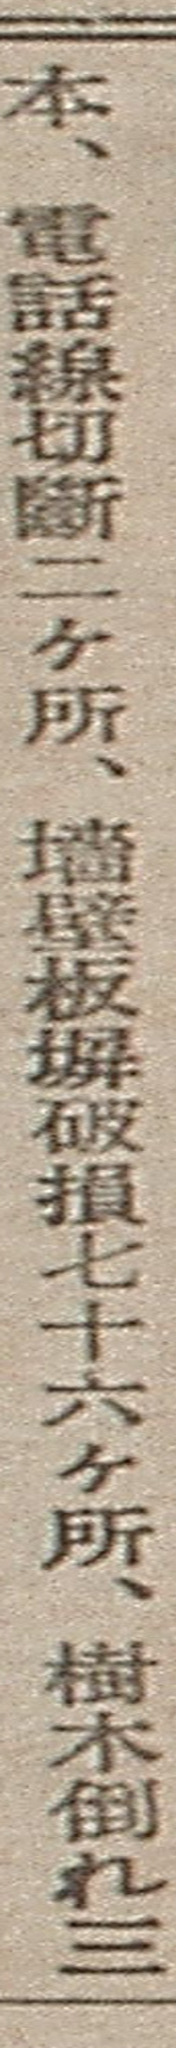本、電話線切断二ケ所、墻壁板塀破損七十六ケ所、樹木倒れ三
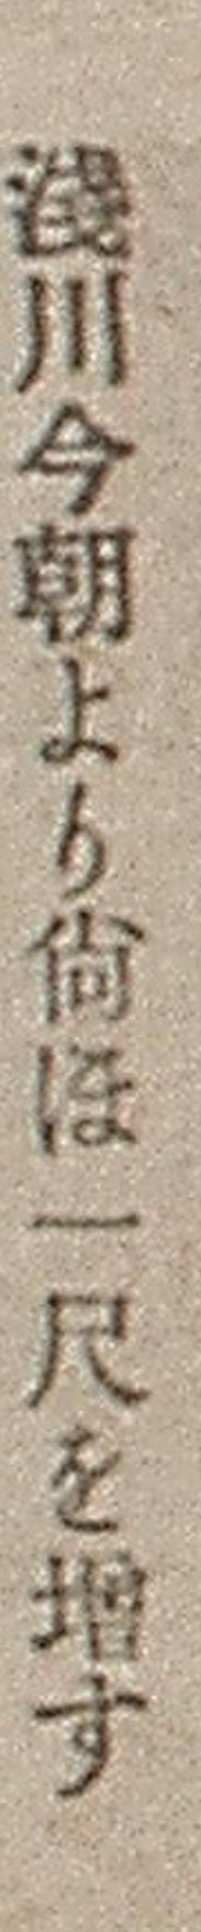浅川今朝より尚ほ一尺を増す
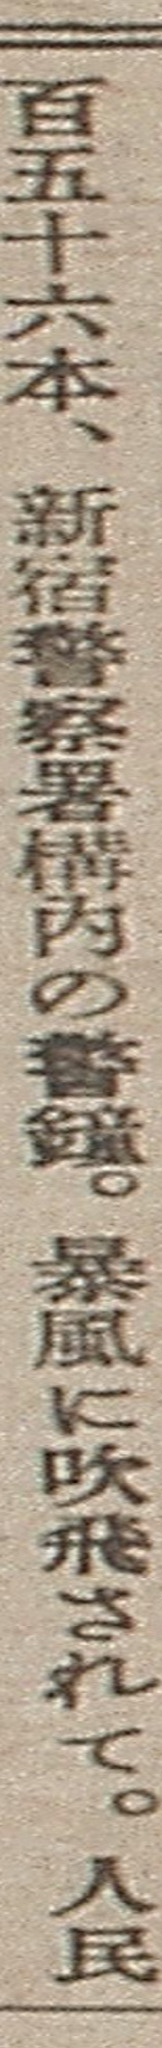百五十六本、新宿警察署構内の警鐘。暴風に吹飛されて。人民
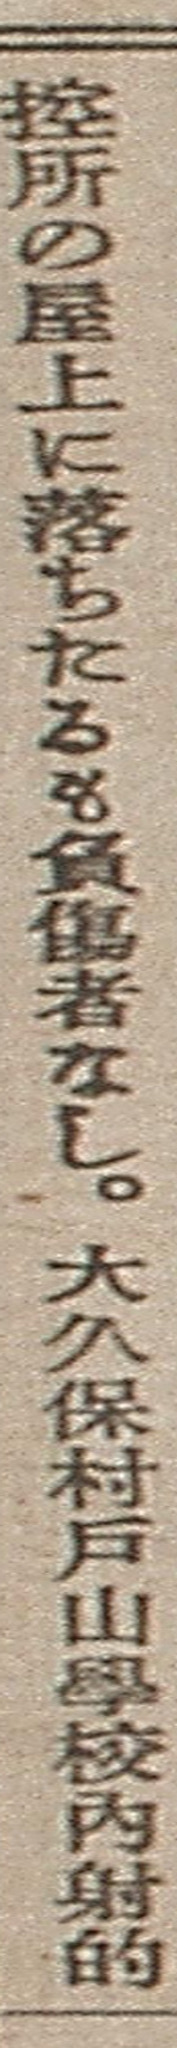控所の屋上に落ちたるも負傷者なし。大久保村戸山学校内射的
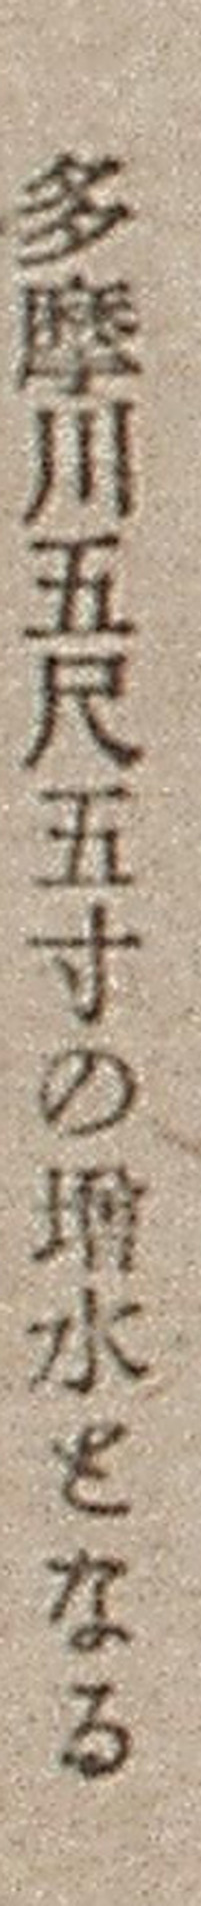多摩川五尺五寸の増水となる

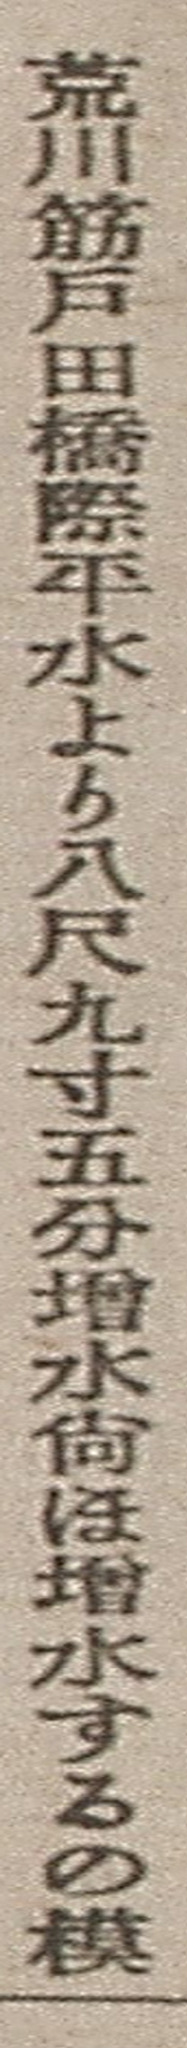荒川筋戸田橋際平水より八尺九寸五分増水尚ほ増水するの模
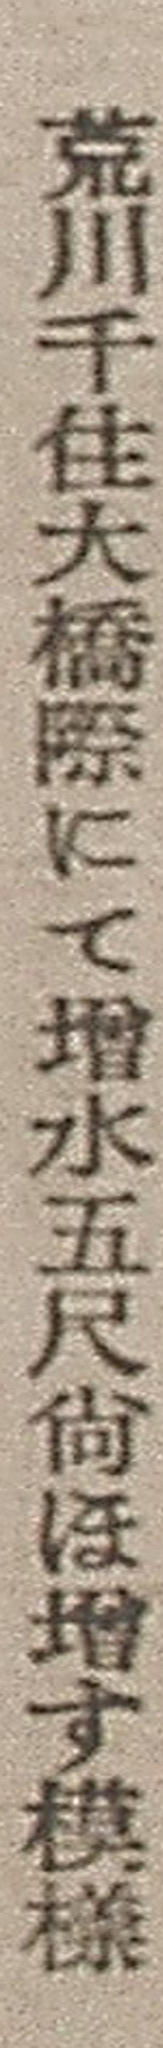荒川千住大橋際にて増水五尺尚ほ増す模様
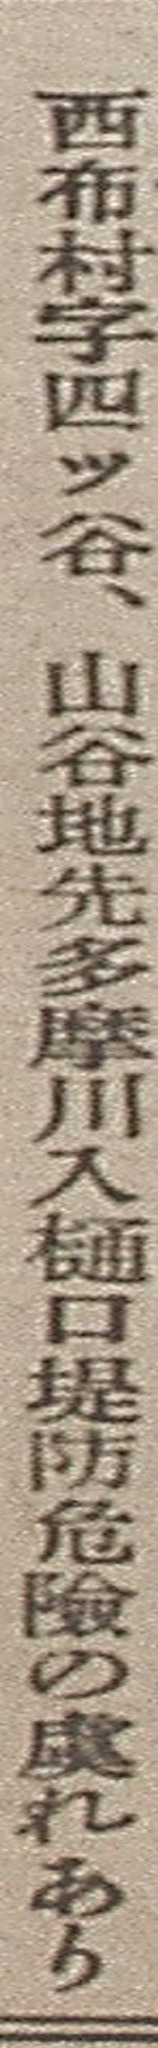西布村字四ツ谷、山谷地先多摩川入樋口堤防危険の虞れあり
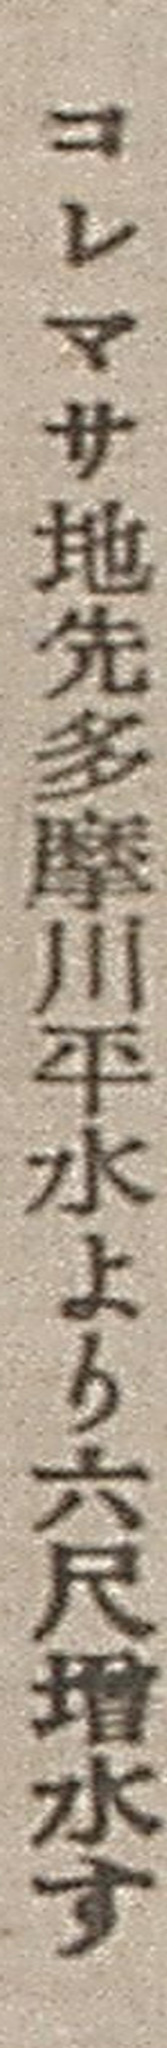コレマサ地先多摩川平水より六尺増水す
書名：風俗畫報臨時増刊第百九十九號　明治三十二年十月各地災害圖會（前編之續）
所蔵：東京大学地震研究所図書室 Earthquake Research Institute Library, The University of Tokyo, JAPAN
